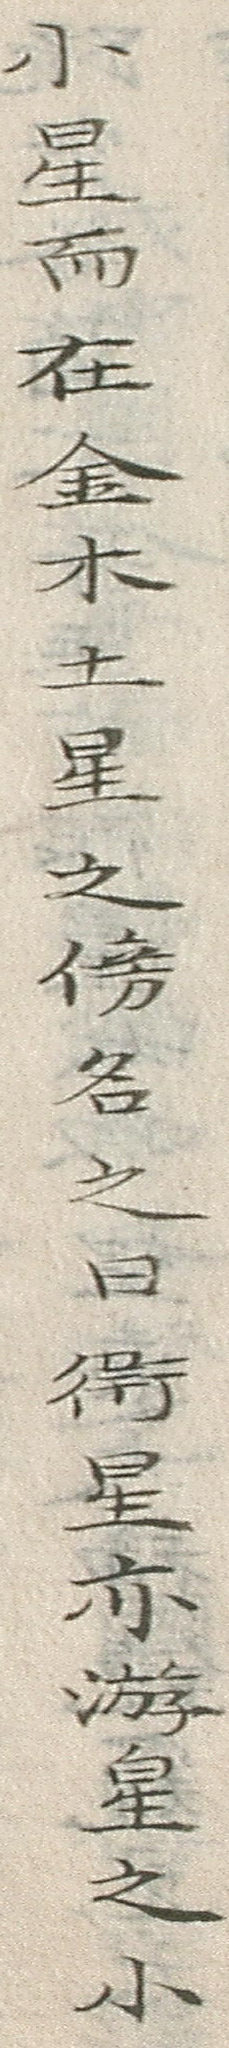小星而在金木土星之傍名之曰衛星亦游星之小
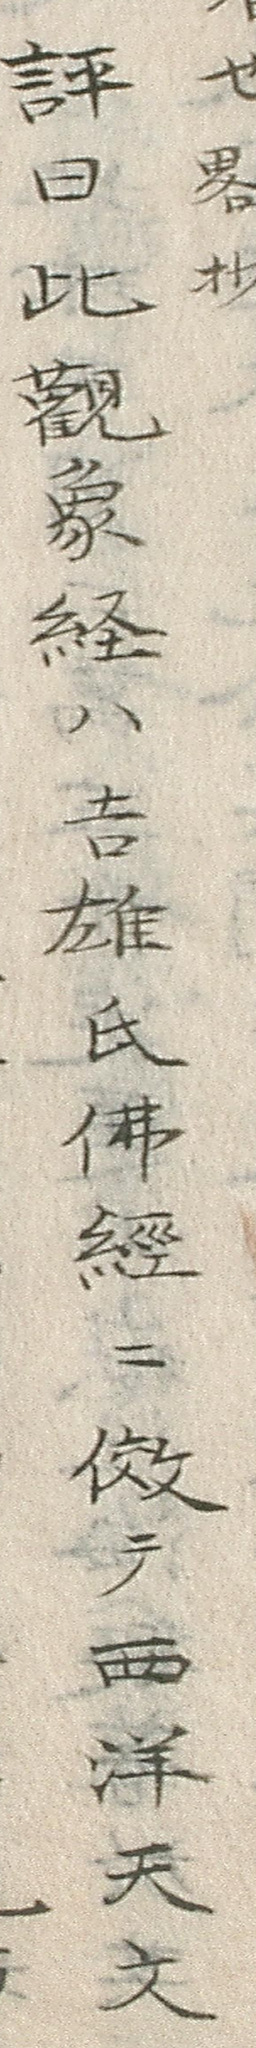評曰此観象経ハ吉雄氏仏経ニ倣テ西洋天文
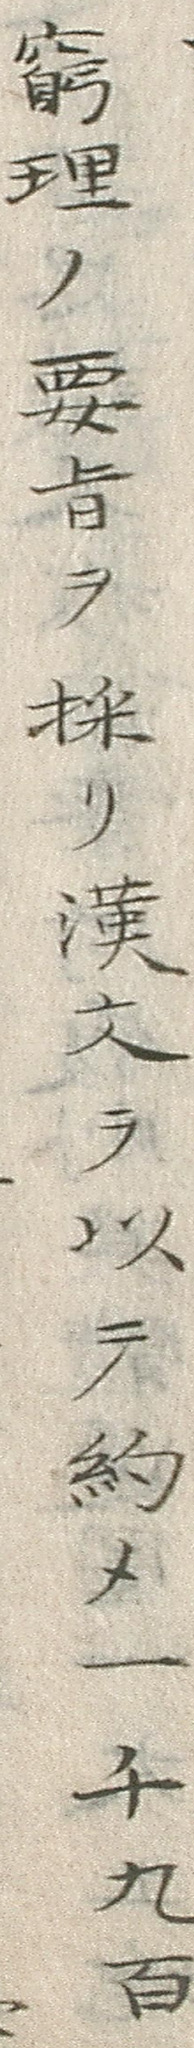窮理ノ要旨ヲ採リ漢文ヲ以テ約シテ一千九百
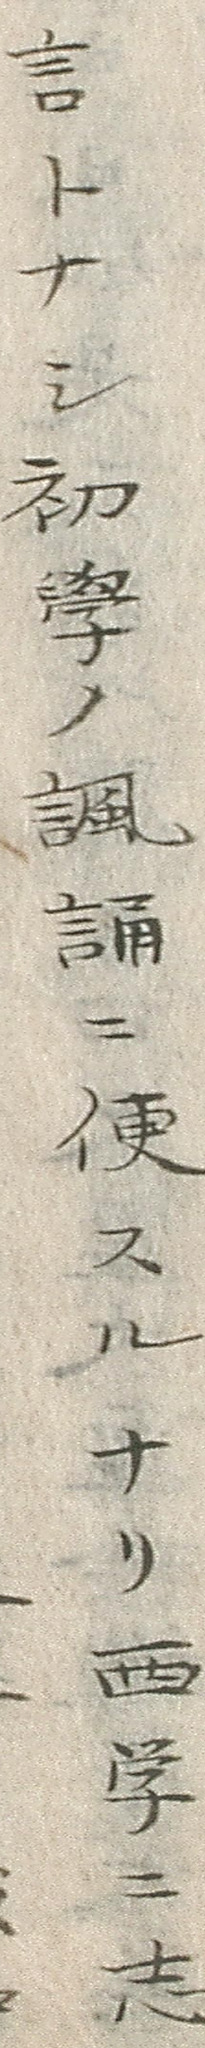言トナシ初学ノ諷誦ニ便スルナリ西学ニ志
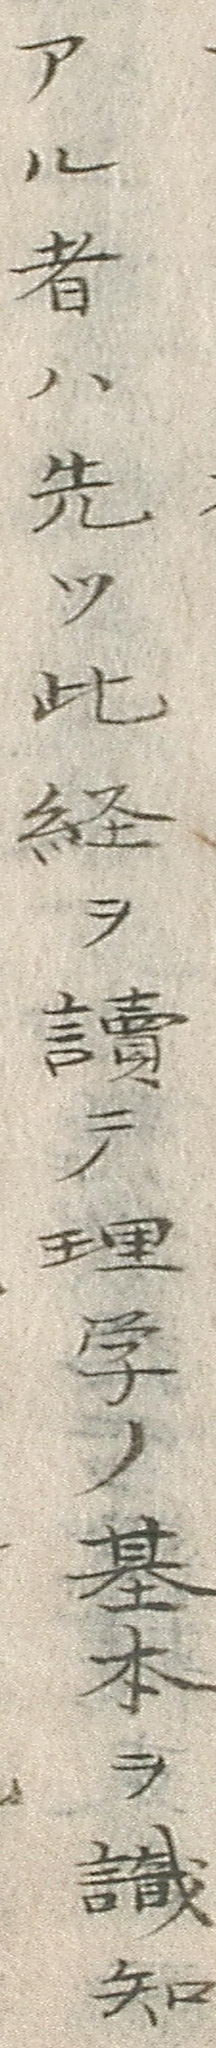アル者ハ先ッ此経ヲ読テ理学ノ基本ヲ識知
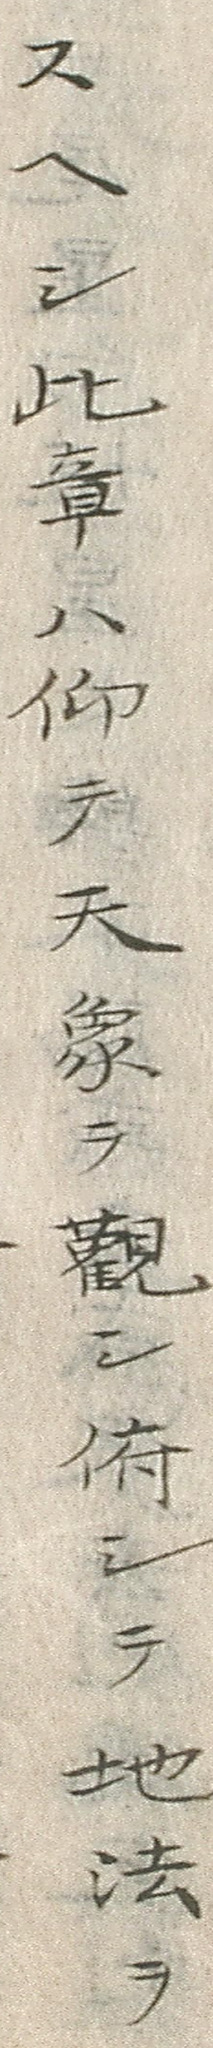スヘシ此章ハ仰テ天象ヲ観シ府シテ地法ヲ
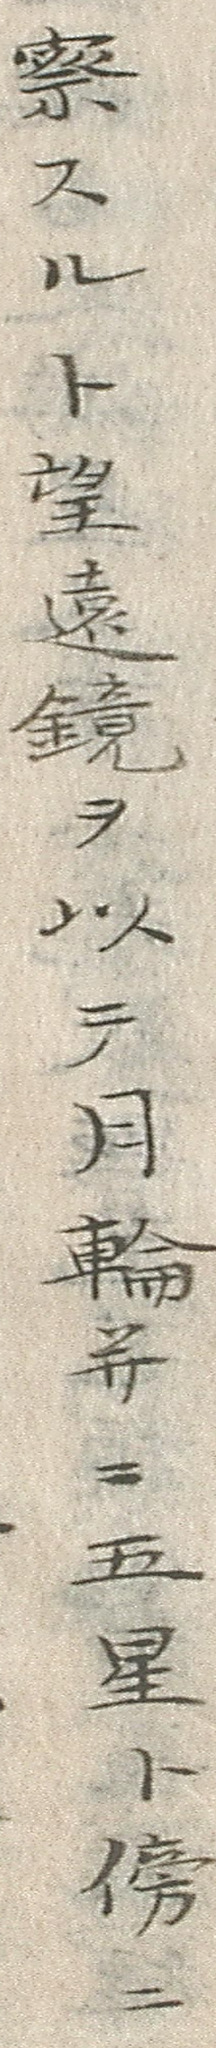察スルト望遠鏡ヲ以月輪并ニ五星ト傍ニ
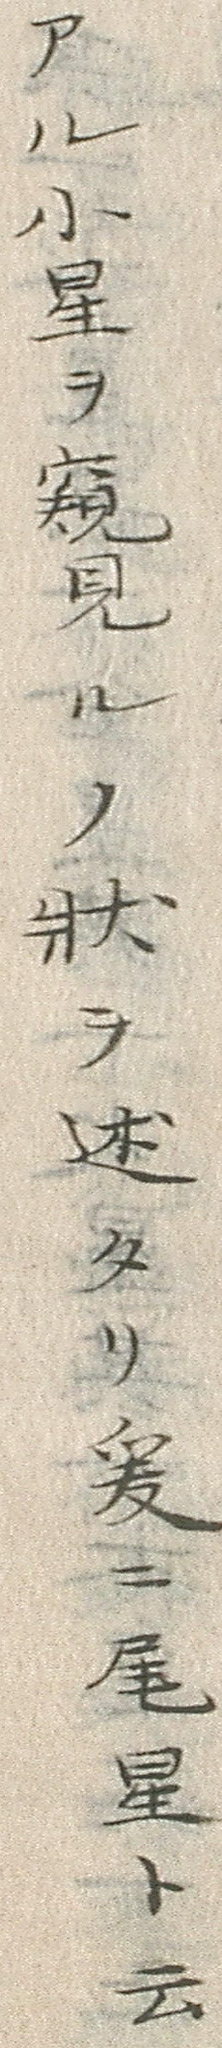アル小星ヲ窺見ルノ状ヲ述タリ爰ニ尾星ト云
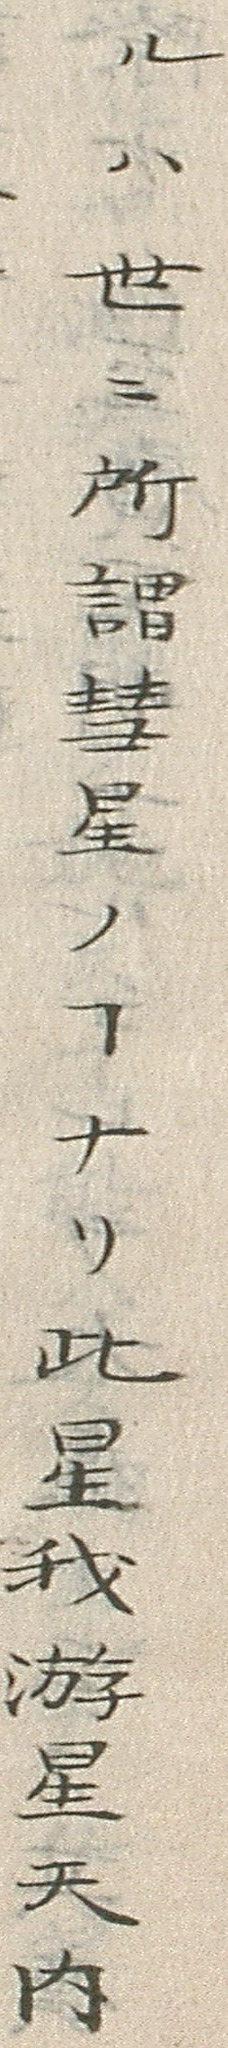ルハ世ニ所謂彗星ノコトナリ此星我游星天内
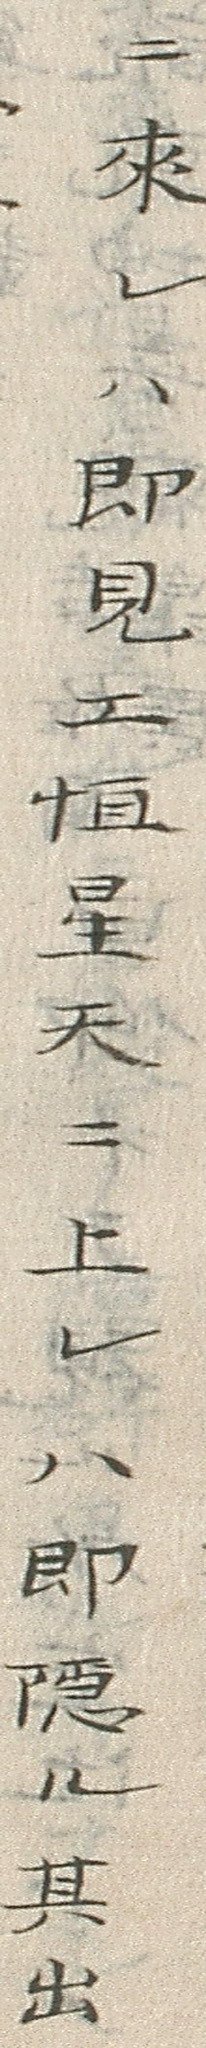ニ来レハ即見エ恒星天ニ上レハ即隠ル其出
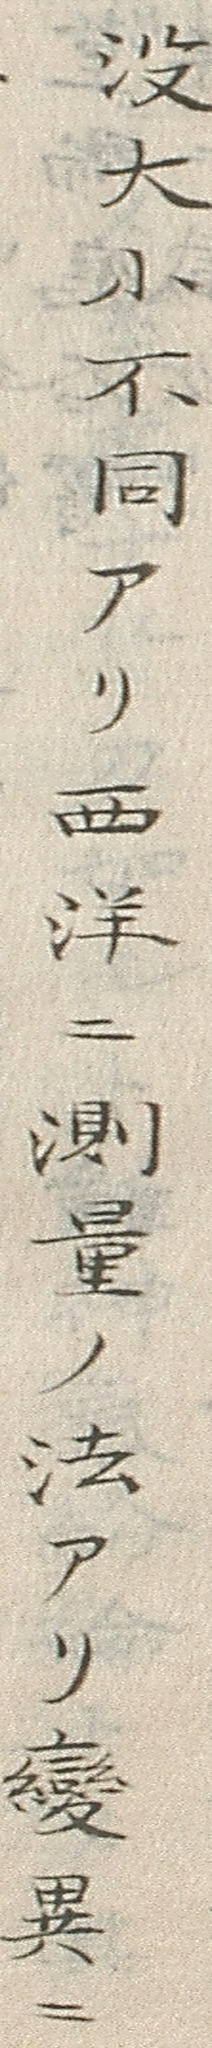没大小不同アリ西洋ニ測量ノ法アリ変異ニ
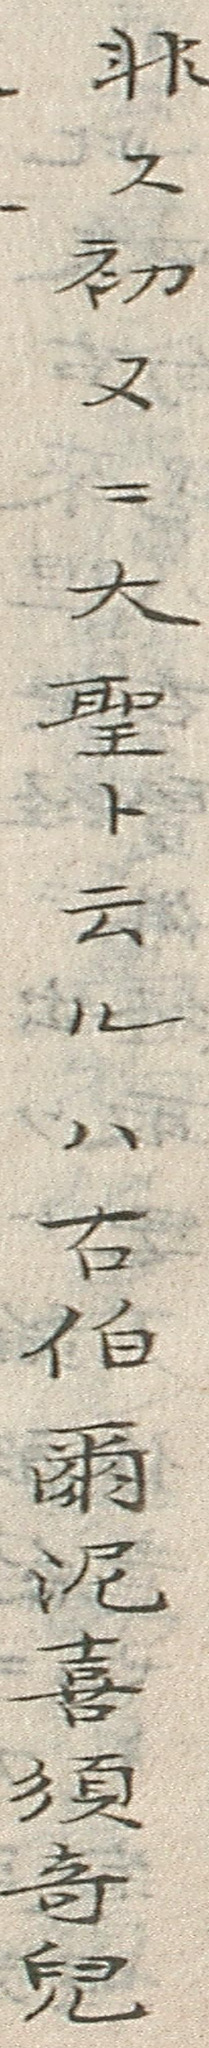非ス初メニ大聖ト云ルハ古伯爾泥喜須奇児
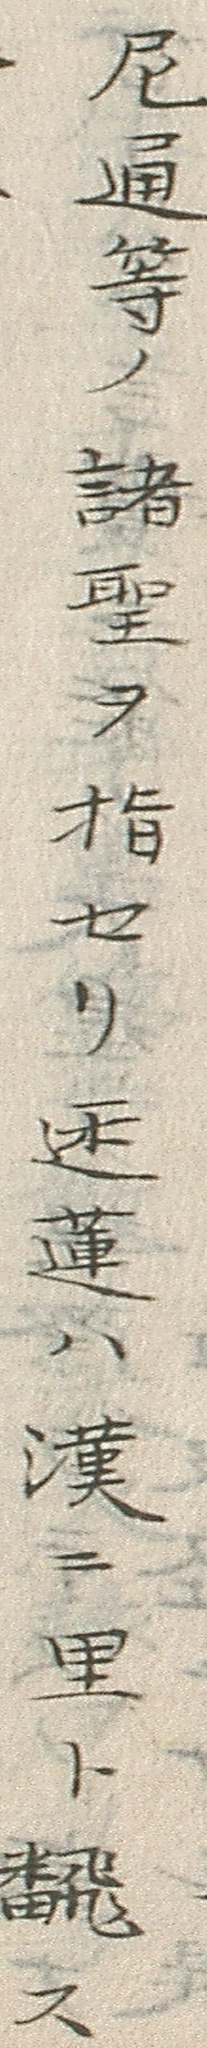尼通等ノ諸聖ヲ指セリ迷蓮ハ漢ニ里ト翻ス
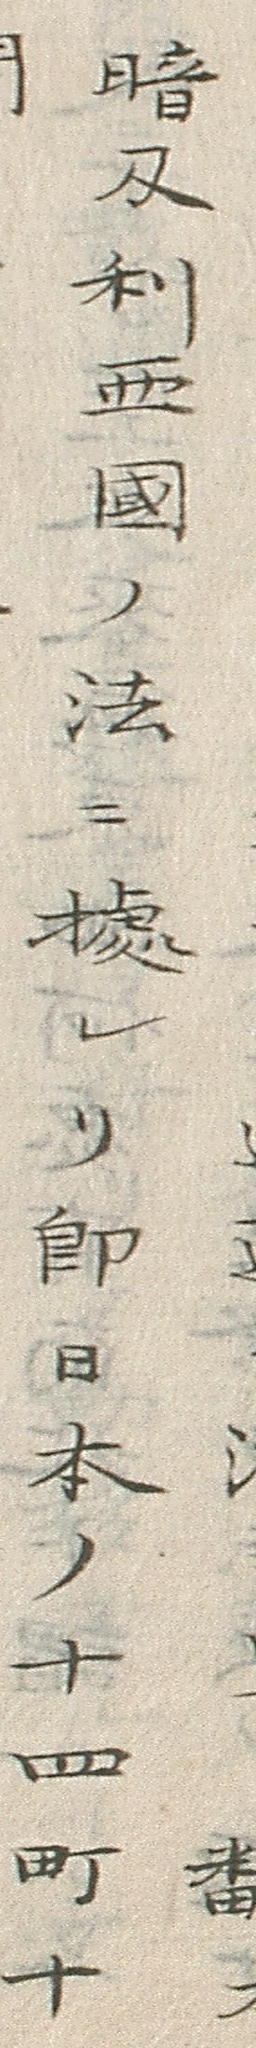暗刃利亜国ノ法ニ拠レリ即日本ノ十四町十
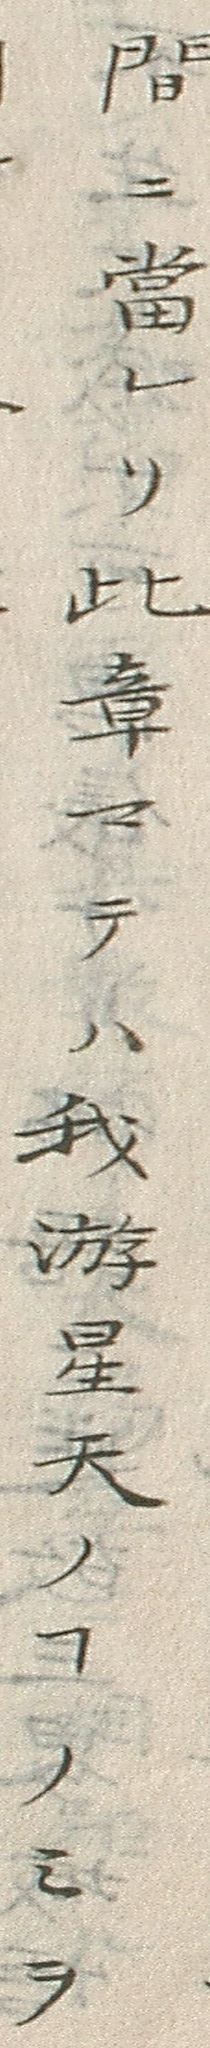間ニ当レリ此章マテハ我游星天ノコトノミヲ
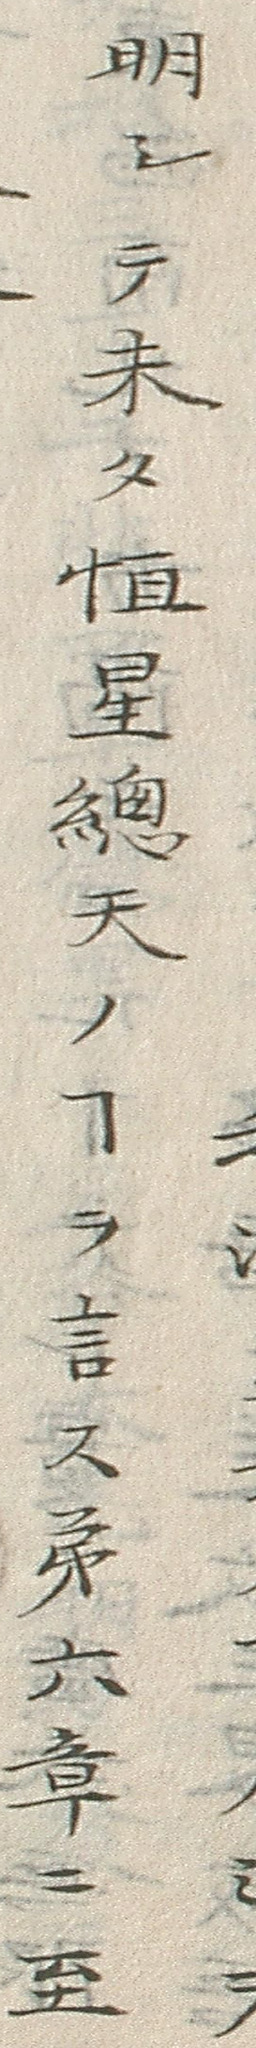明シテ未タ恒星総天ノコトヲ言ス第六章ニ至
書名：天學略名目羽翼　全
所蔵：東京大学地震研究所図書室 Earthquake Research Institute Library, The University of Tokyo, JAPAN
